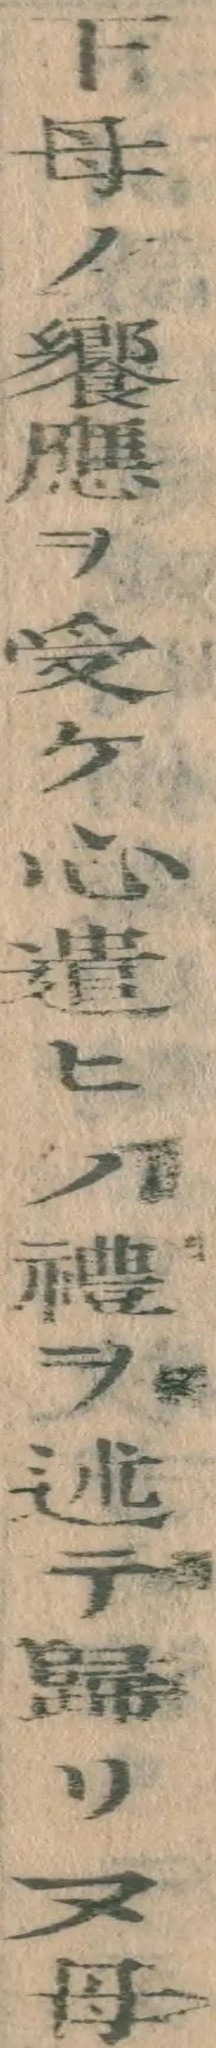下母ノ饗応ヲ受ケ心遣ヒノ礼ヲ述テ帰リヌ母
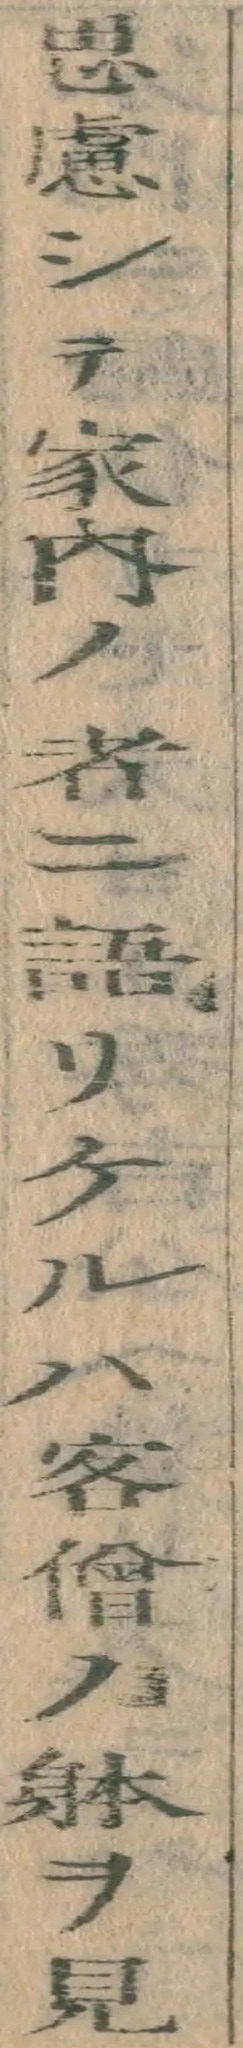思慮シテ家内ノ者ニ語リケルハ客僧ノ体体ヲ見
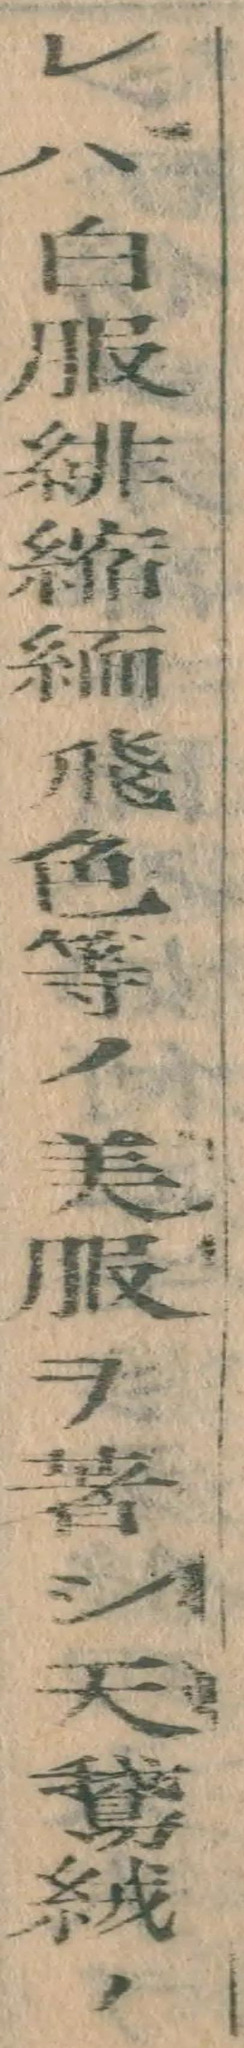レハ白服緋縮緬飛色等ノ美服ヲ著シ天鵝絨ノ
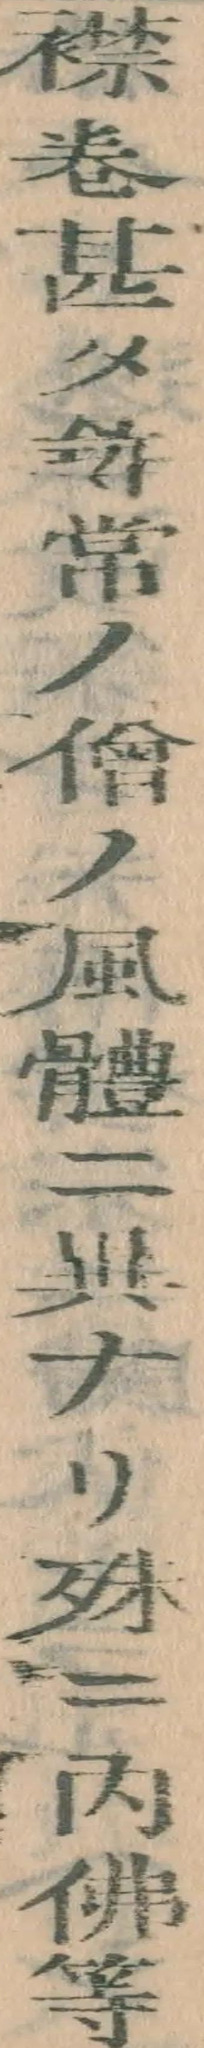襟巻甚タ尋常ノ僧ノ風体ニ異ナリ殊ニ内仏等
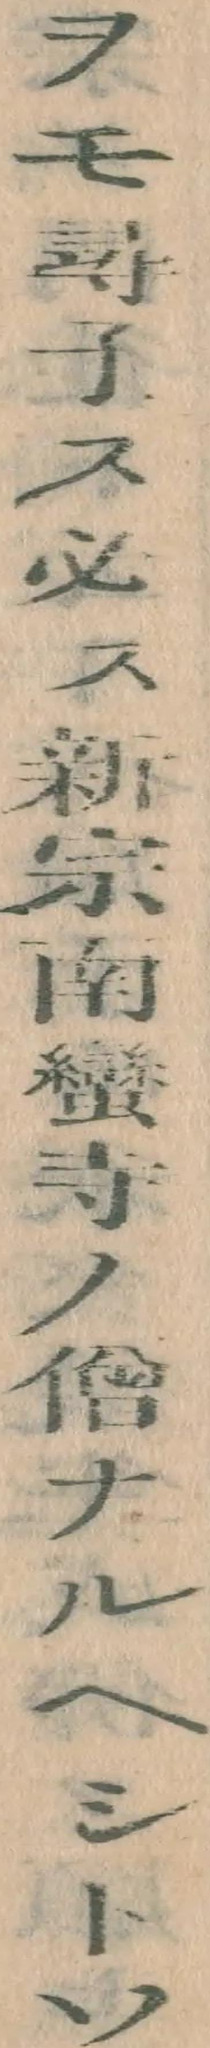ヲモ尋ネス必ス新宗南蛮寺ノ僧ナルヘシトソ
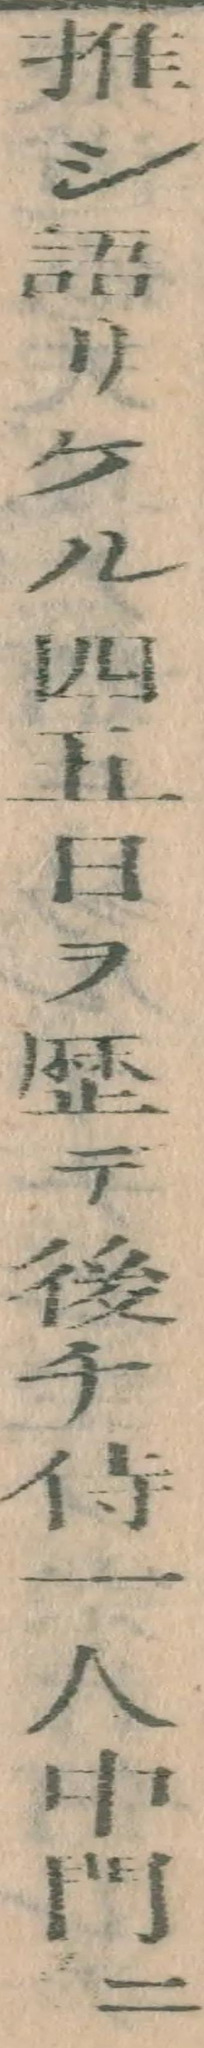推シ語リケル四五日ヲ歴テ後チ侍一人中門ニ
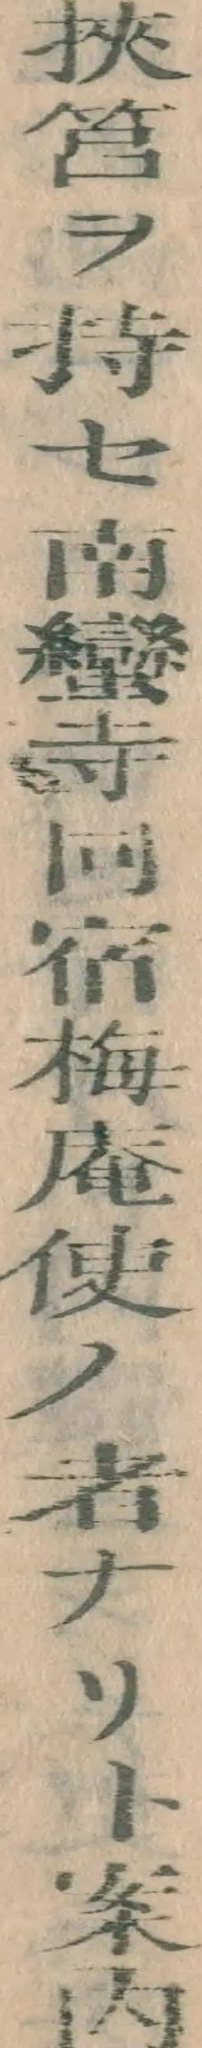挟筥ヲ持セ南蛮寺同宿梅庵使ノ者ナリト案内
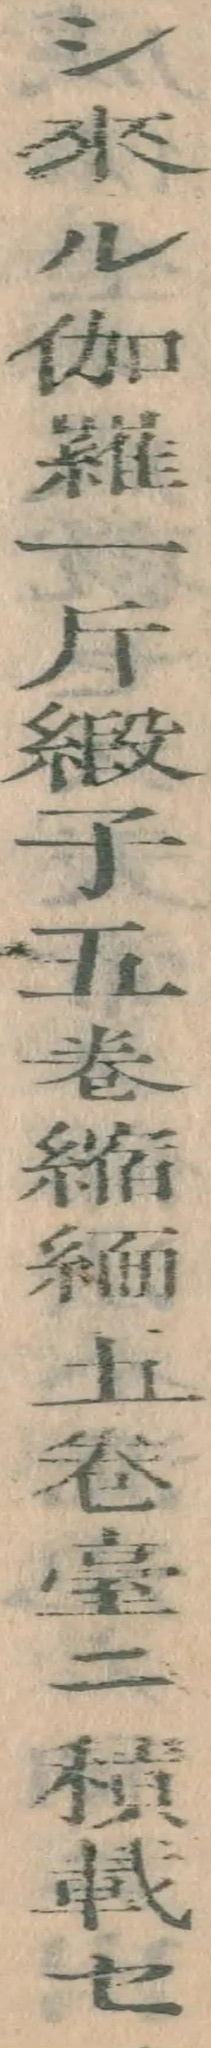シ来ル伽羅一斤緞子五巻縮緬五卷台ニ積載セ
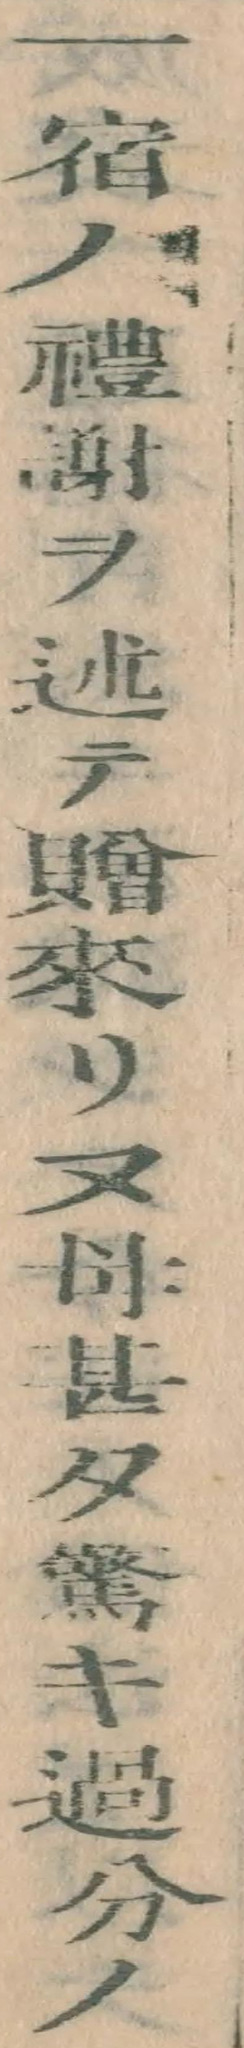一宿ノ礼謝ヲ述テ贈来リヌ母甚タ驚キ過分ノ
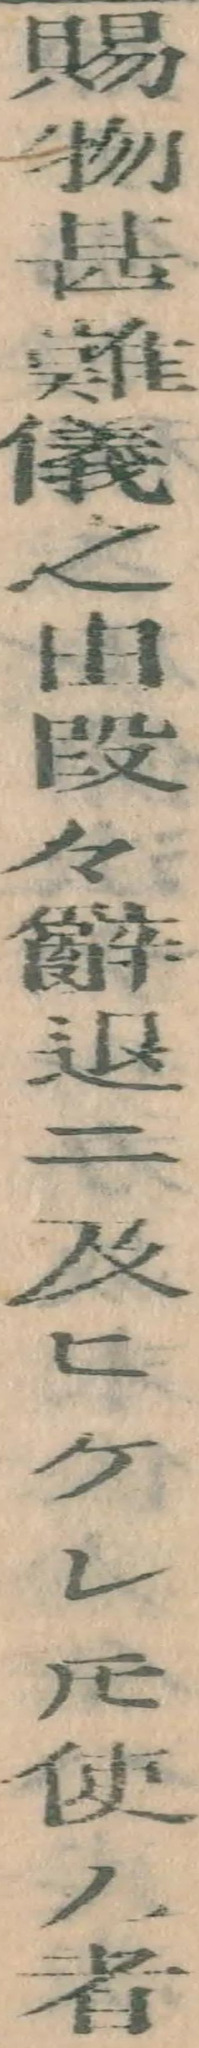賜物甚難儀之由段々辞退ニ及ヒケレトモ使ノ者
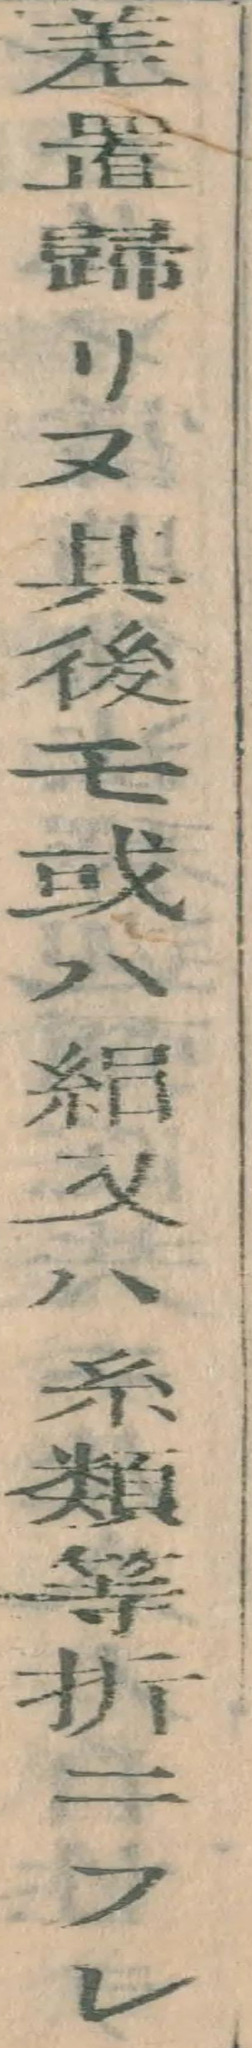差置帰リヌ其後モ或ハ絽又ハ糸類等折ニフレ
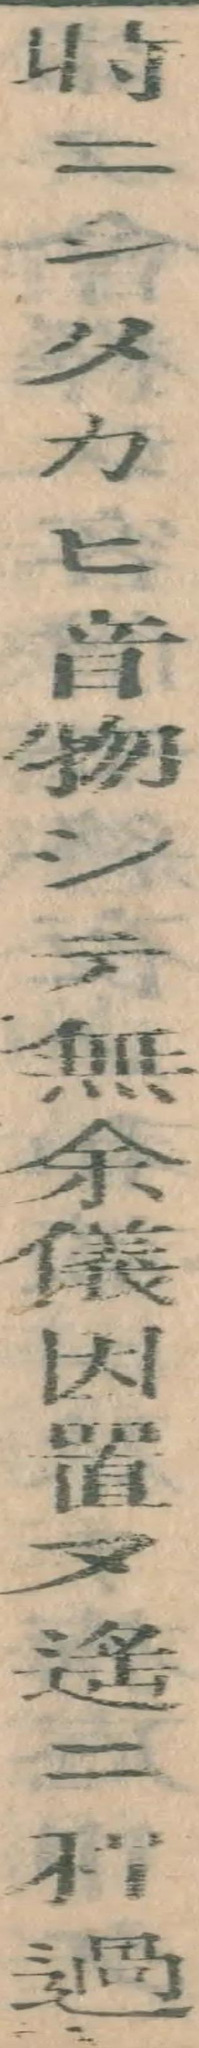時ニシタカヒ音物シテ無余儀因置ヌ遥ニ程過
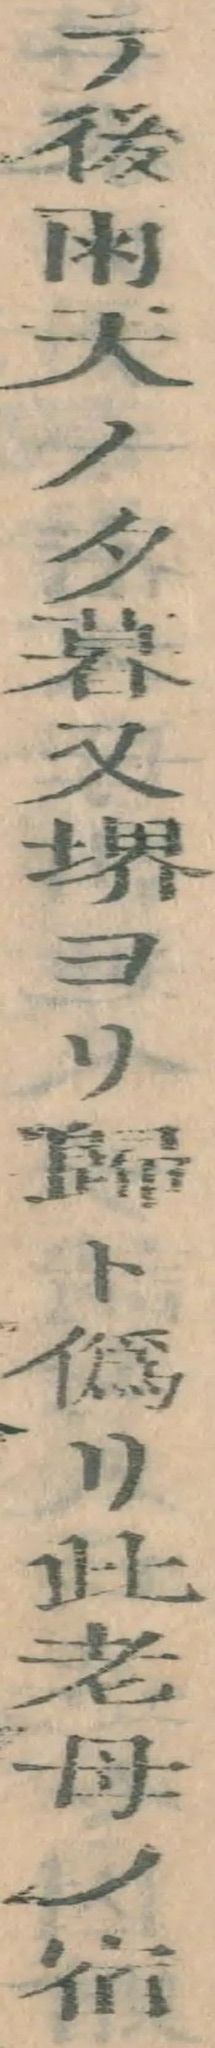テ後雨天ノ夕暮又堺ヲリ帰ト偽リ此老母ノ宿

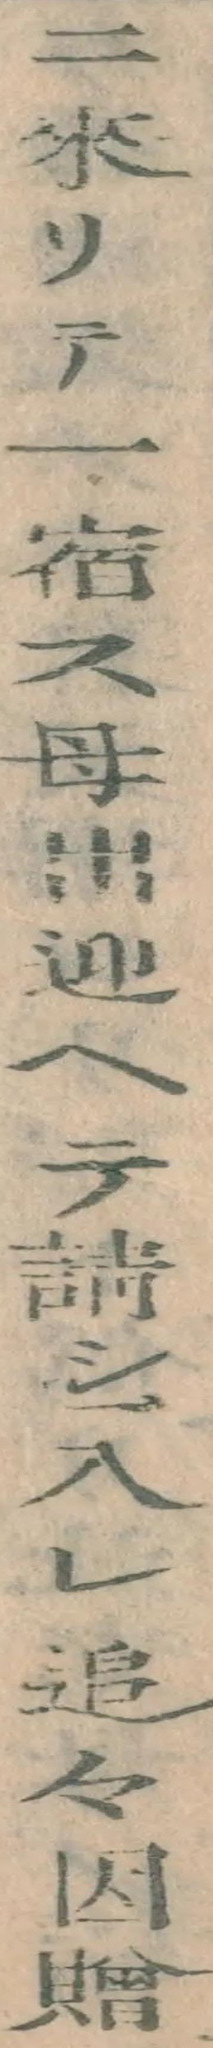ニ来リテ一宿ス母出迎ヘテ請シ入レ追々因贈
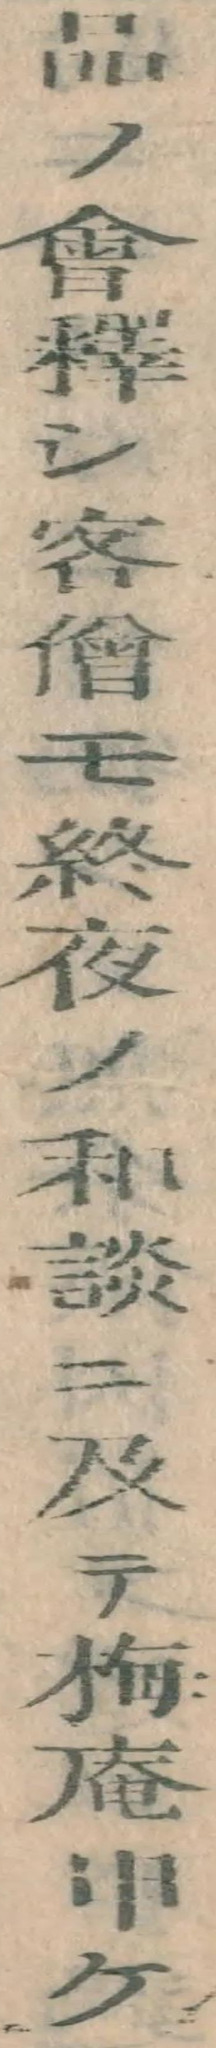品ノ会釈シ客僧モ終夜ノ和談ニ及テ梅庵申ケ
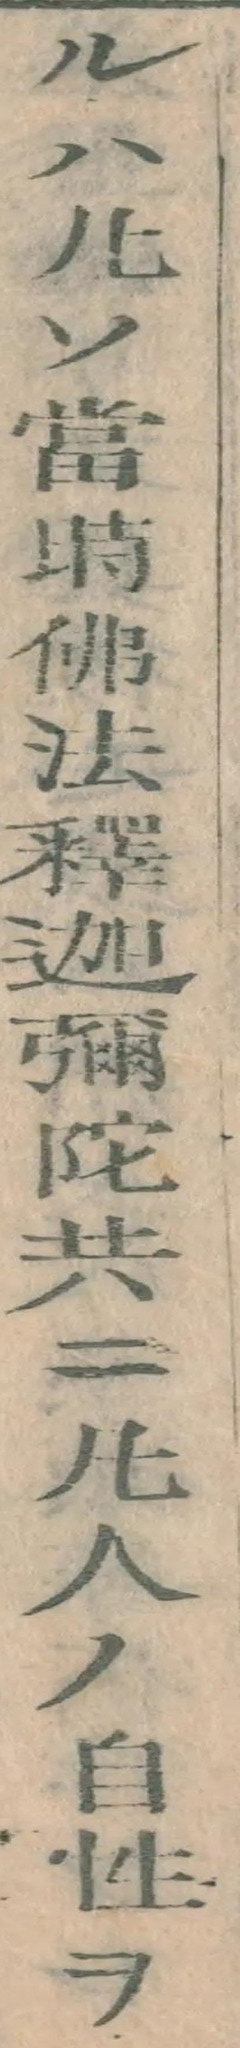ルハ凡ソ当時仏法釈迦弥陀共ニ凡人ノ自性ヲ
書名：南蛮寺興廃記
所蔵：国立国会図書館 National Diet Library, JAPAN
